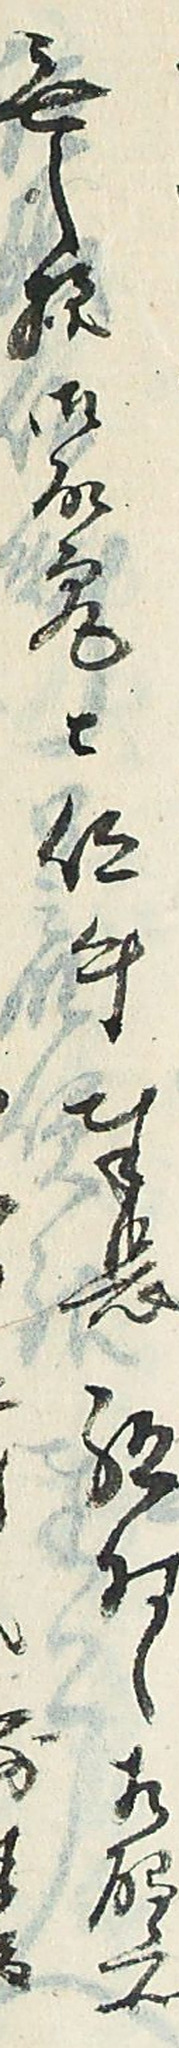無之様御取究被仰付奉畏組村へ相触候所
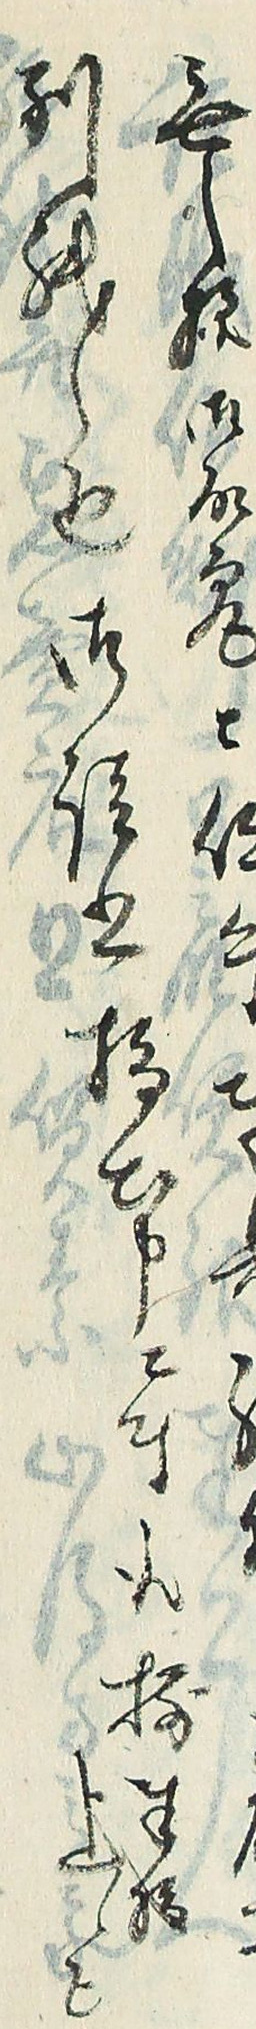通御請書指出申に付取揃奉指上候以上
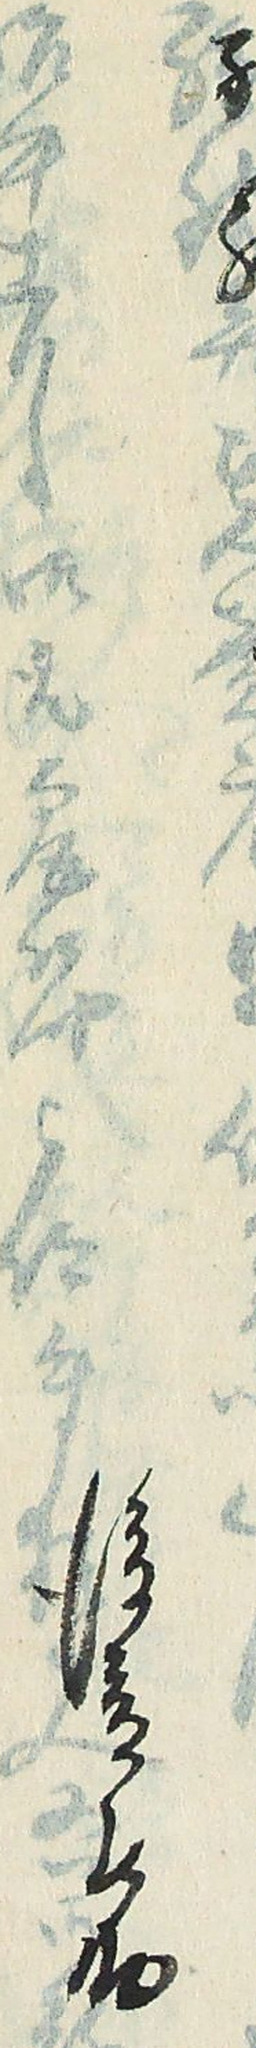後藤庄助
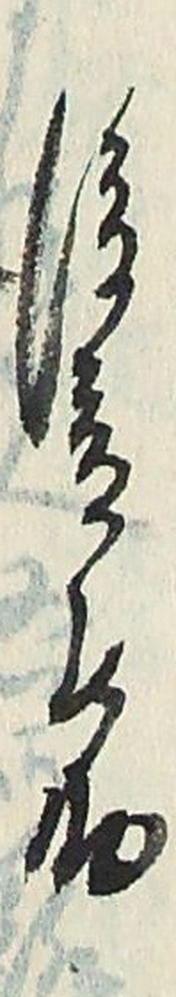後藤庄助
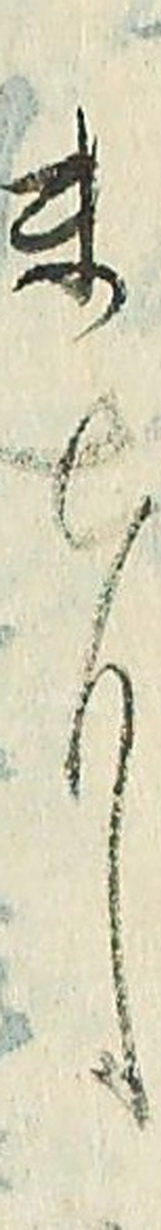未七月
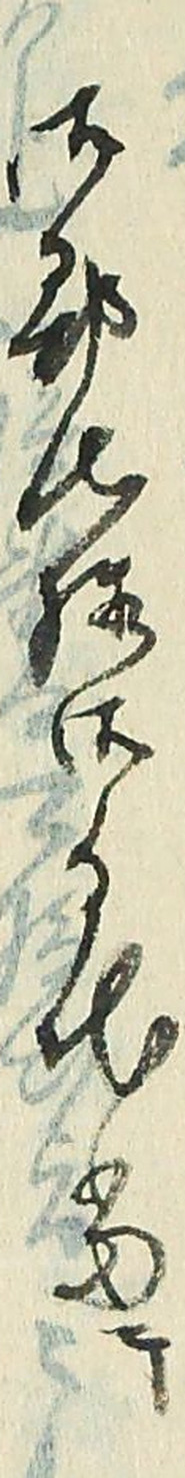御郡代様御手代当て
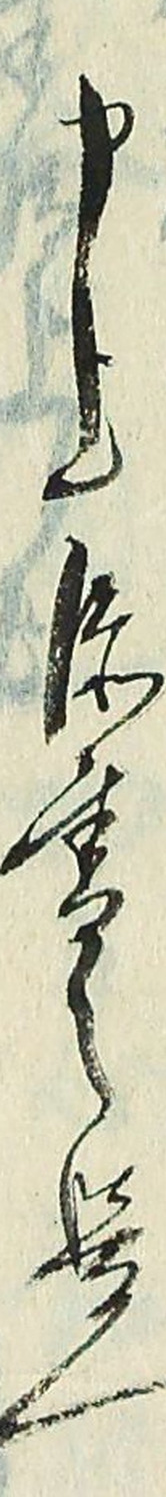申上添書之覚
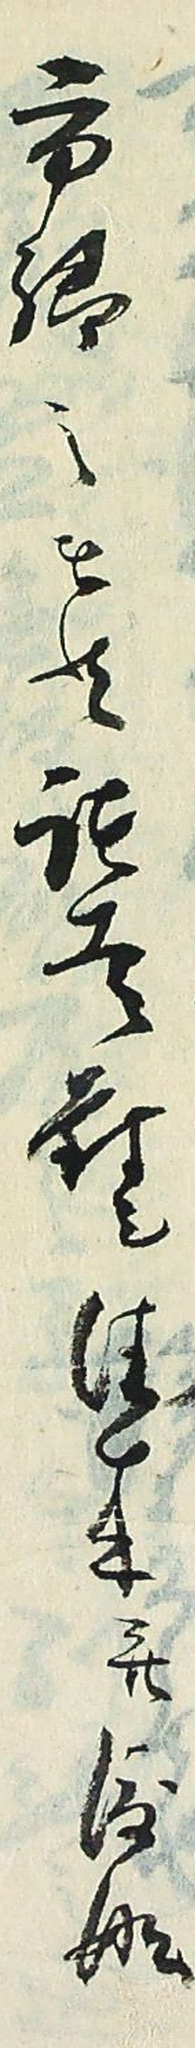市郷の者共諸士に対し往来幷渡船
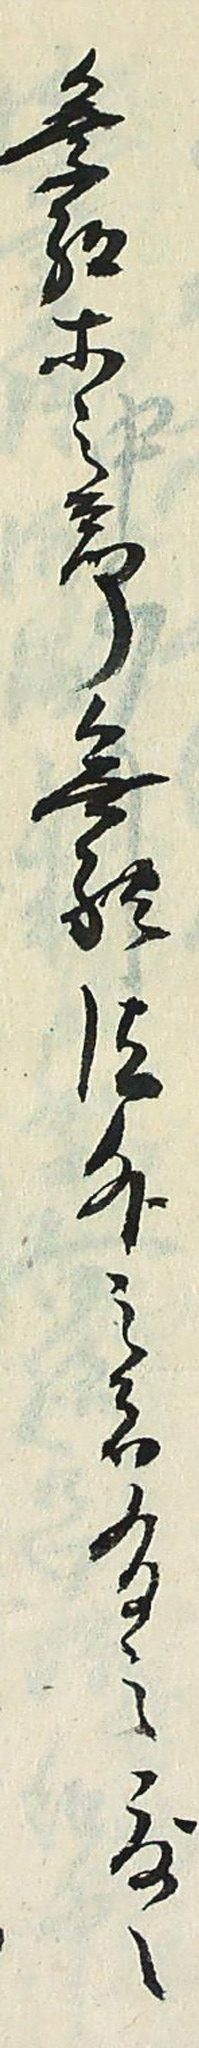乗組等之節無礼法外之者有之度々
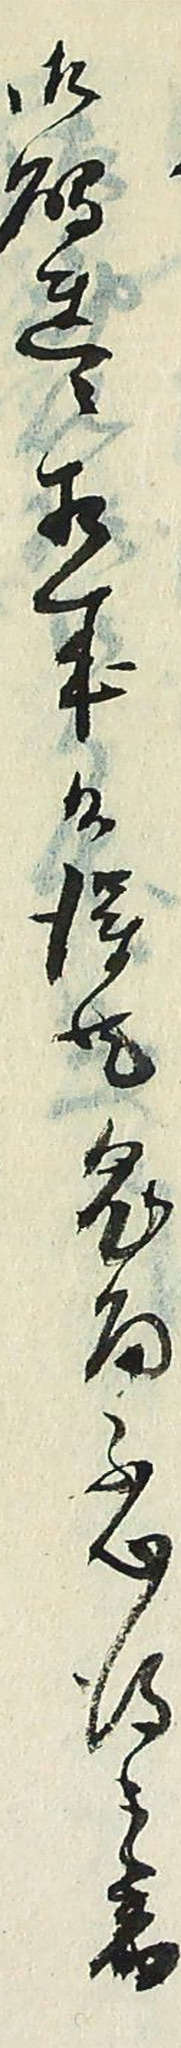御触達に相成候得共兎角不心得之者
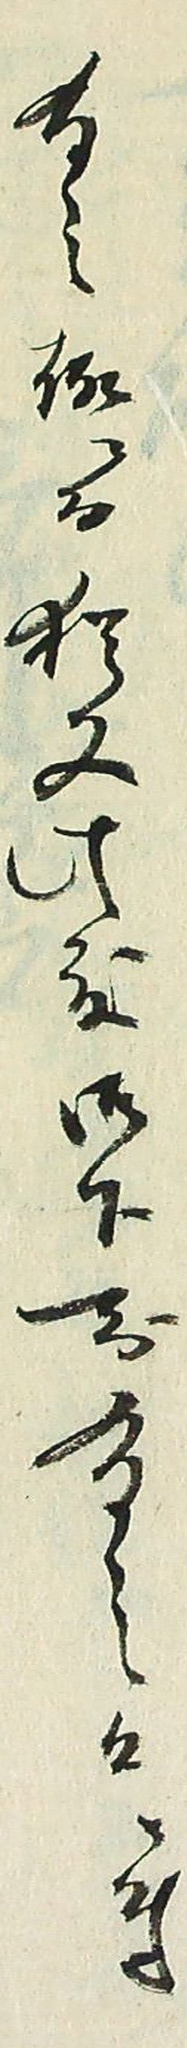有之趣に而猶又此度御下知有之候に付
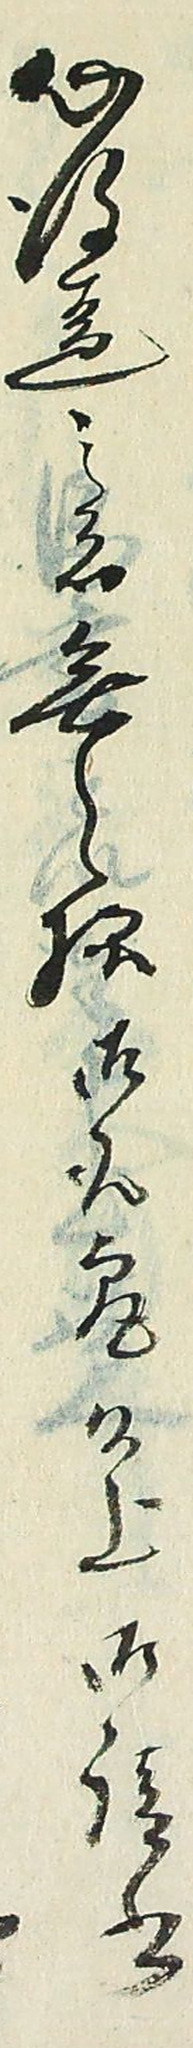心得違之者無之様御取究候上御請書
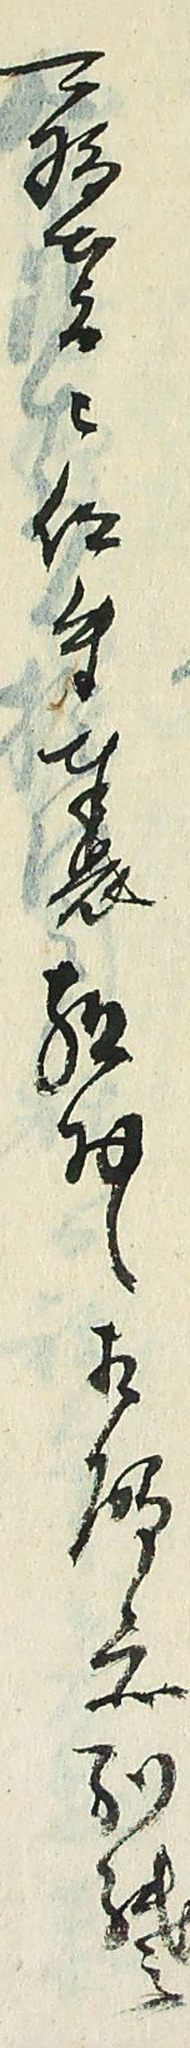可指出旨被仰付奉畏組村へ相触候所別紙之
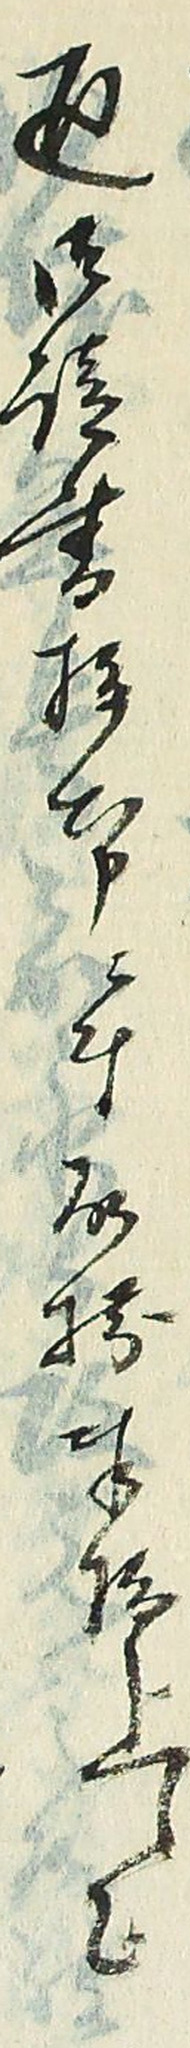通御請書指出申に付取揃奉指上候以上
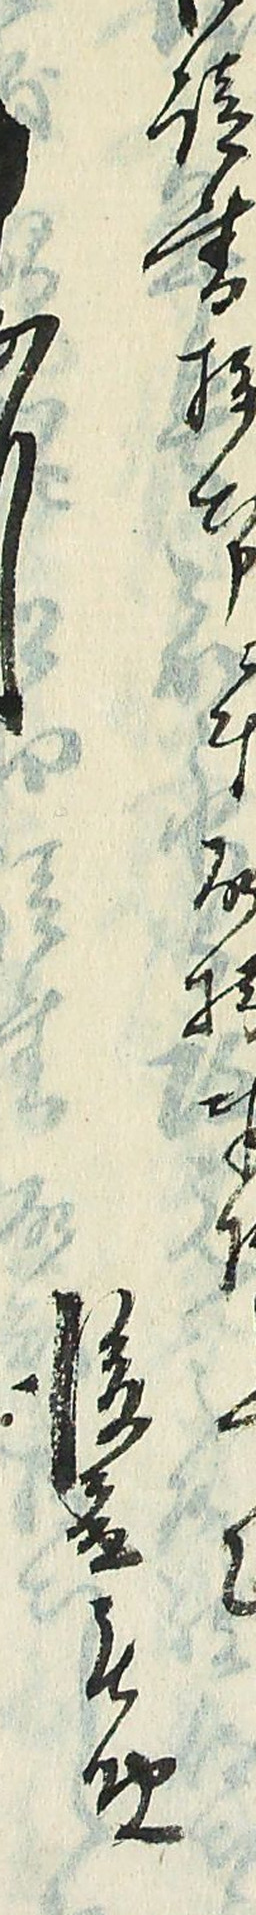後藤庄助
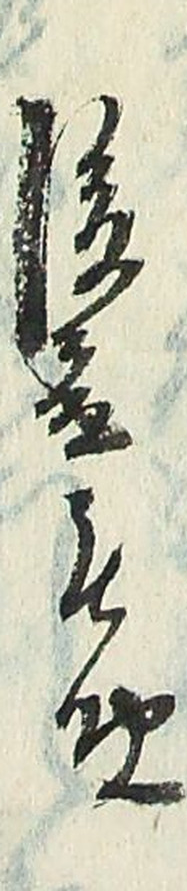後藤庄助
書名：諸御用御□受書控
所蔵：鳴門教育大学 Naruto University of Education
